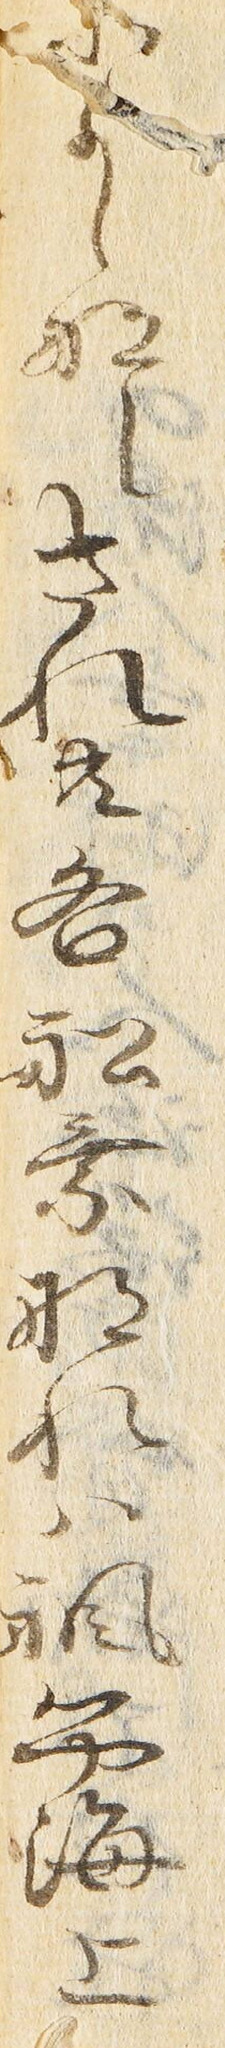によしなしされ共か各船乗なれは諷筋海上
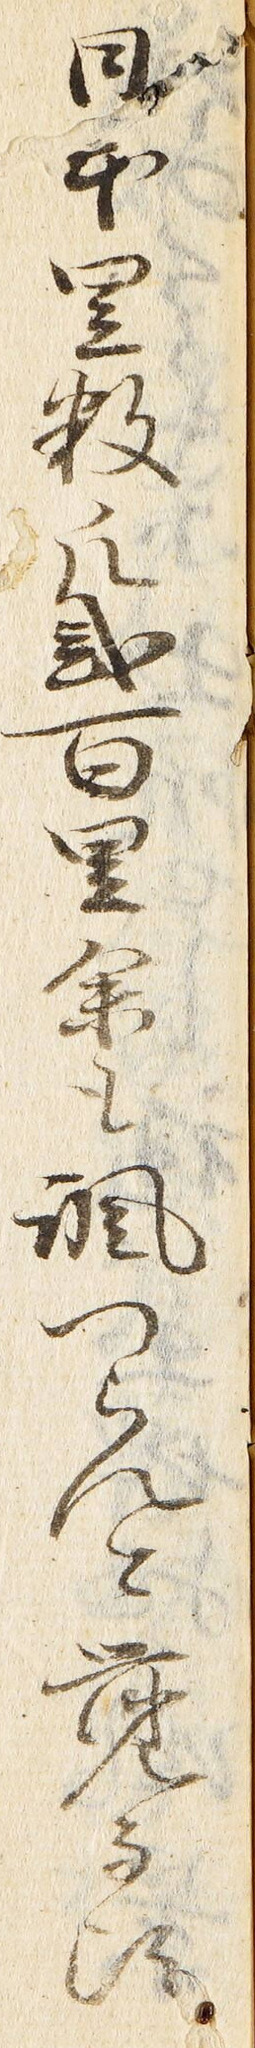日本里数凡弐百里余も諷つらんと覚る頃
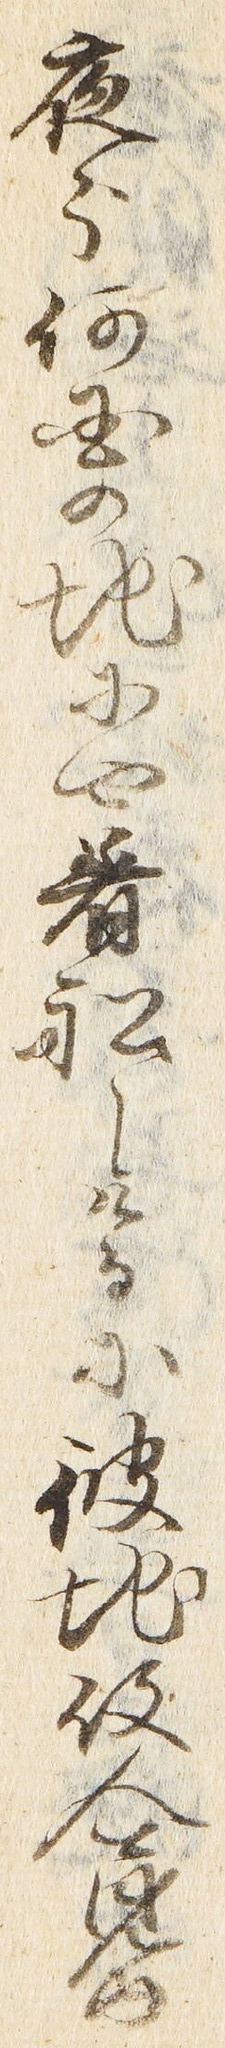夜分何国の地にや着船しけるに彼地役人と見ゆ
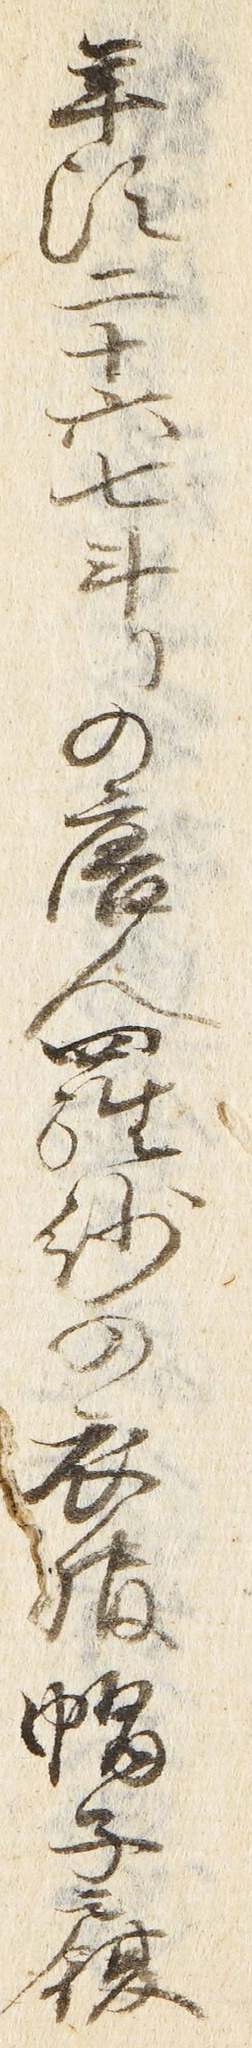年頃二十六七計りの唐人羅紗の衣服帽子履
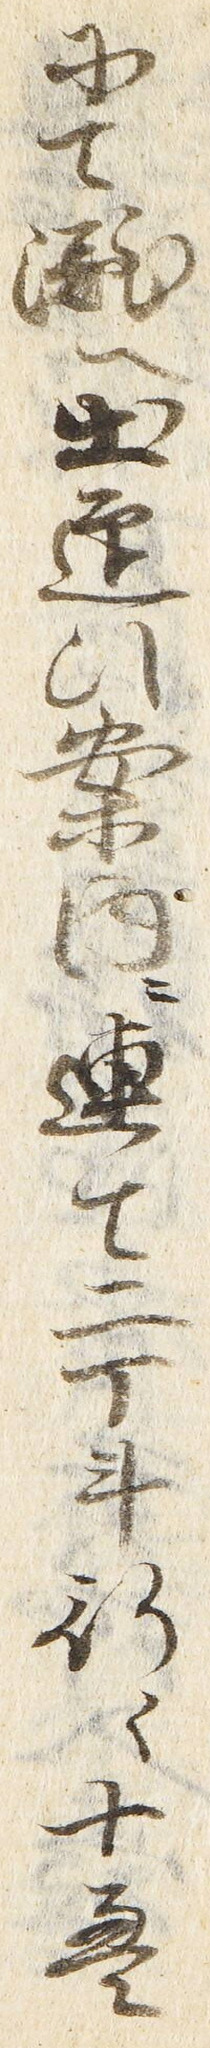にて灘へ出迎ひ案内に連て二丁計行く十畳
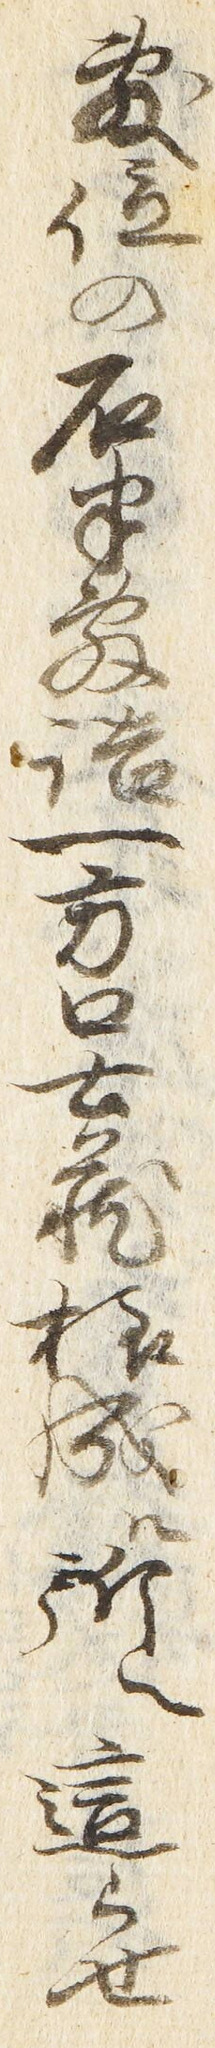敷位の石半敷詰一方口土蔵様成る所へ這らせ
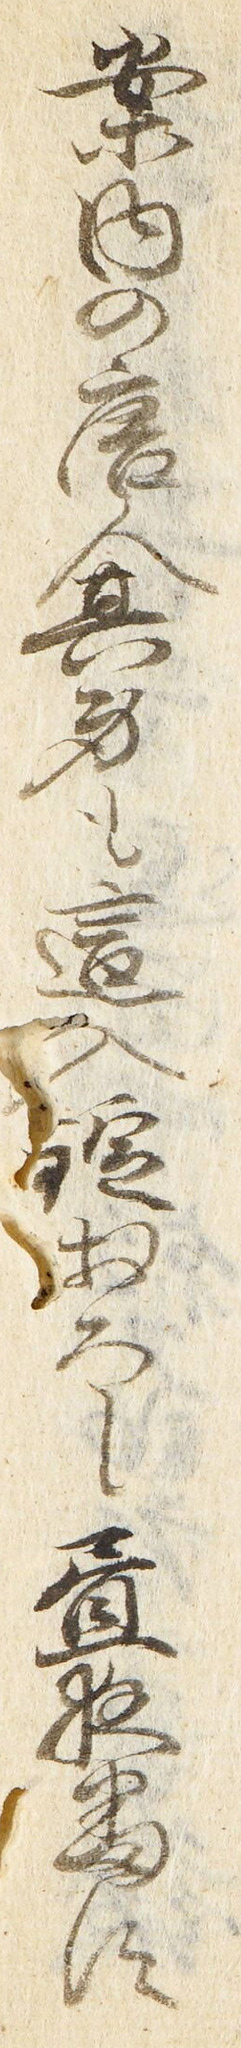案内の唐人其身も這入錠おろし昼夜番す

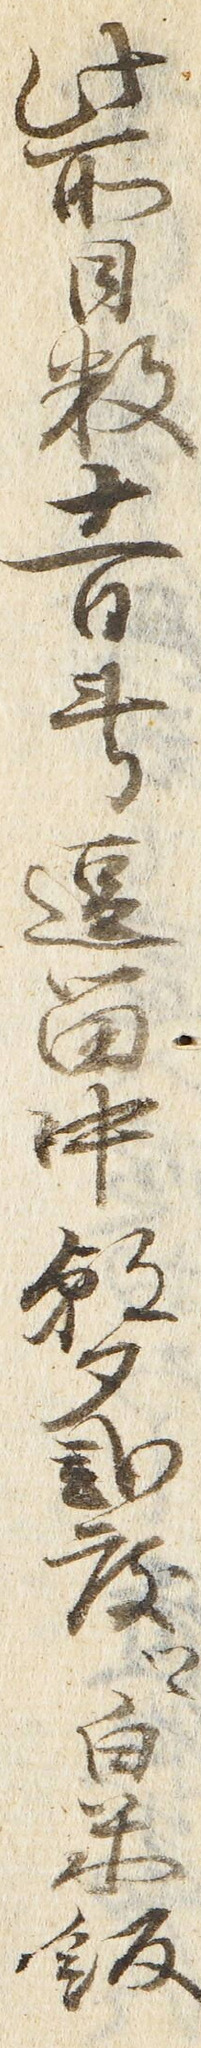此所日数十一日計り逗留中朝夕弐度ツヽ白米飯
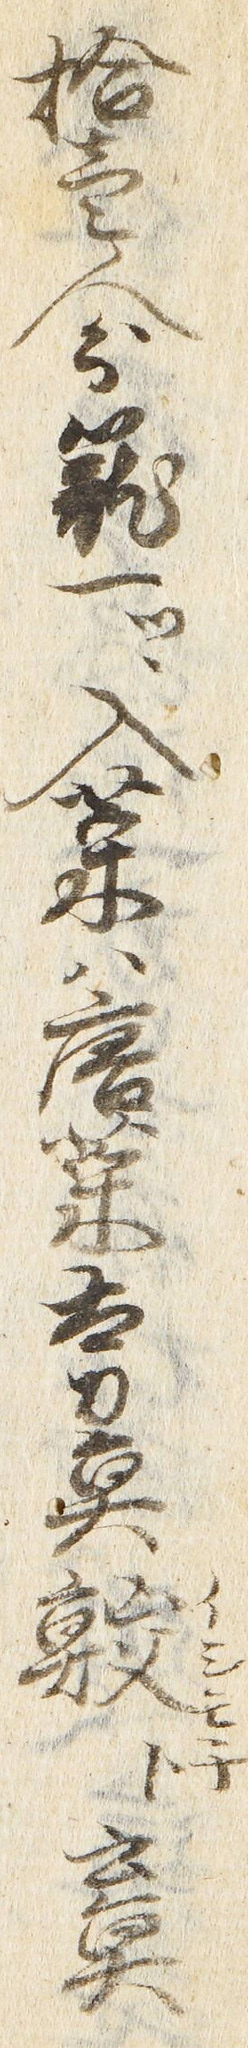拾壱人分籠一ツヽ入菜は広菜太刀魚鯼と云魚
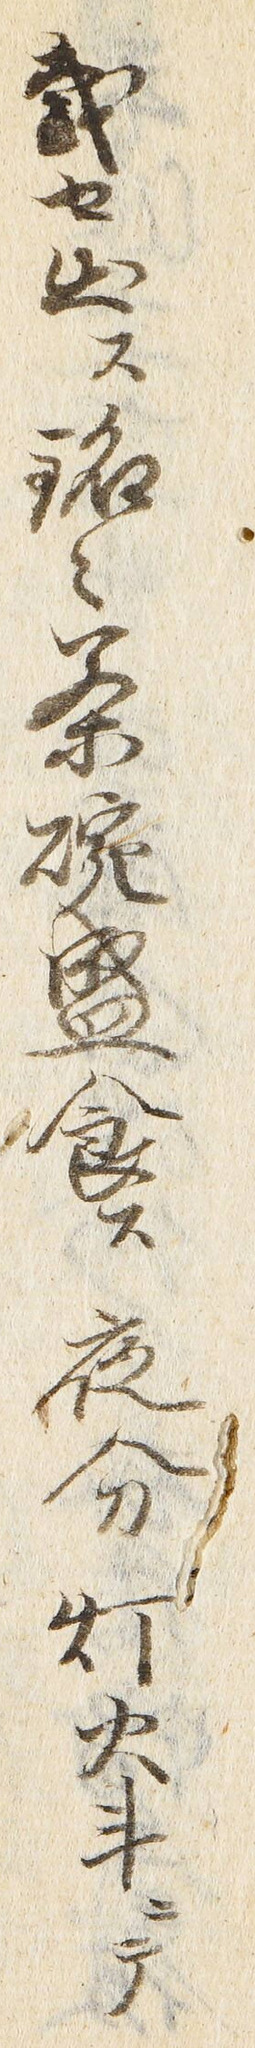載せ出す銘々茶碗盛食す夜分灯火計にて
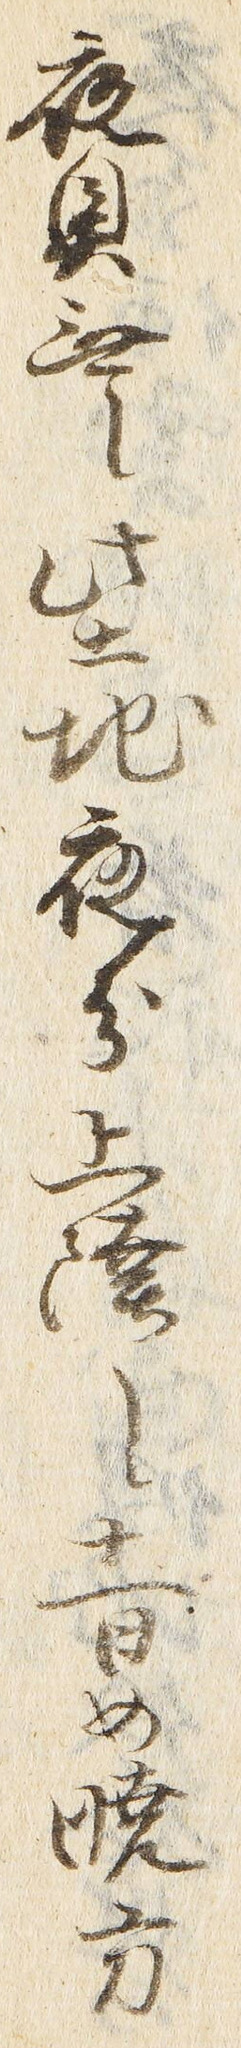夜具無し此土地夜分上陸し十一日め暁方
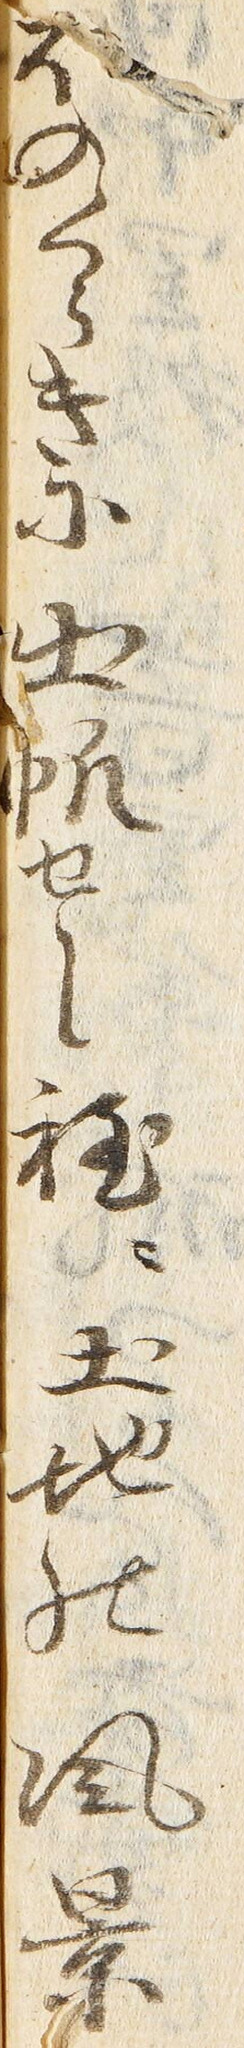ほのくらきに出帆せし程に土地の風景
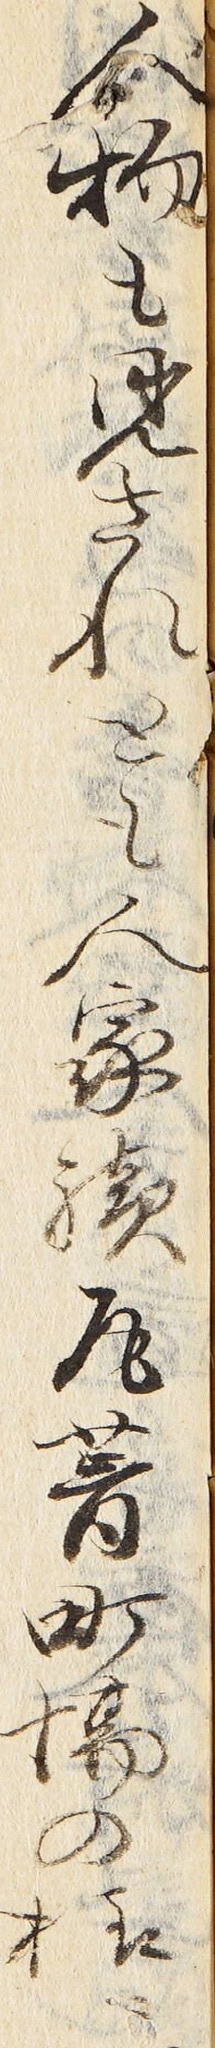人物も見されとも人家続瓦葺町場に様
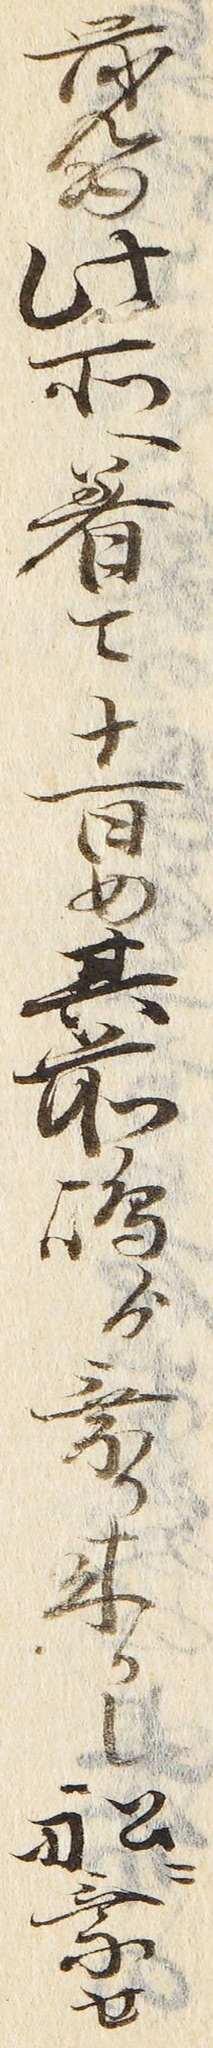覚ゆ此所へ着て十一日め其前島ゟ乗り来るし船に乗せ
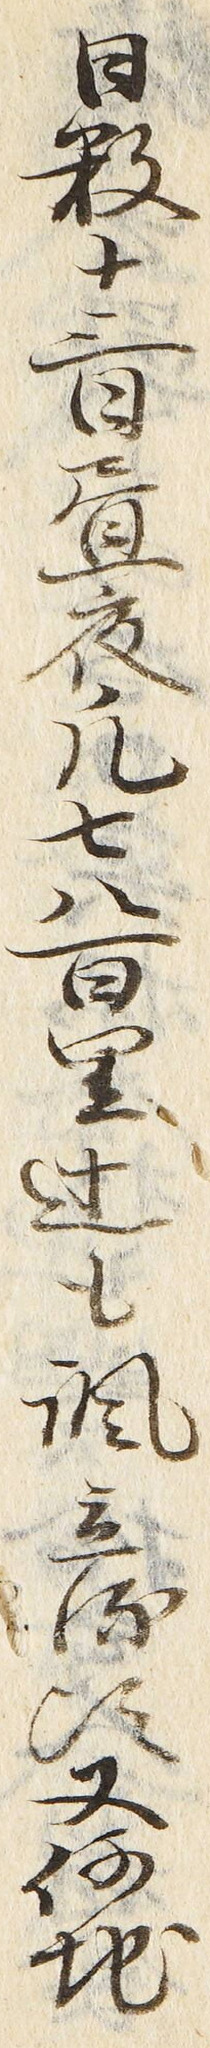日数十三日昼夜凡七八百里辻も諷立る頃又何地
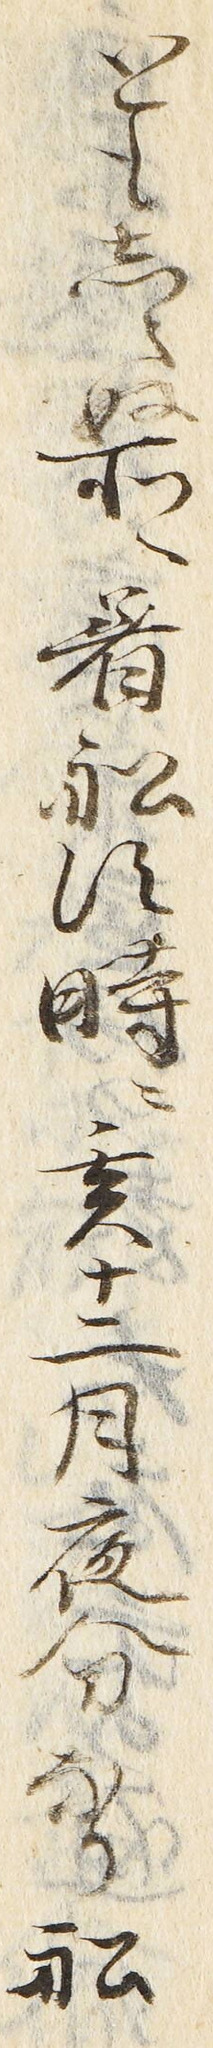ともしらぬ所へ着船す時に亥十二月夜分なり船
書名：唐物語
